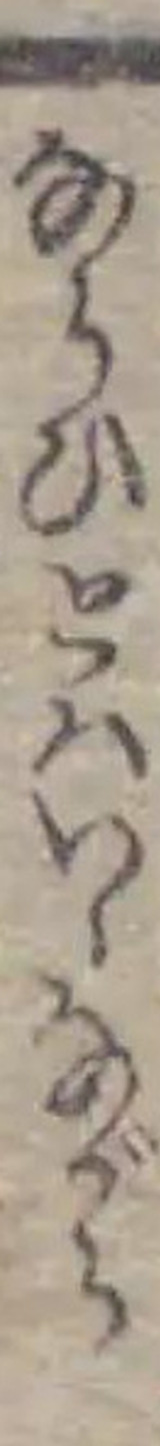ならひとはいゝながら
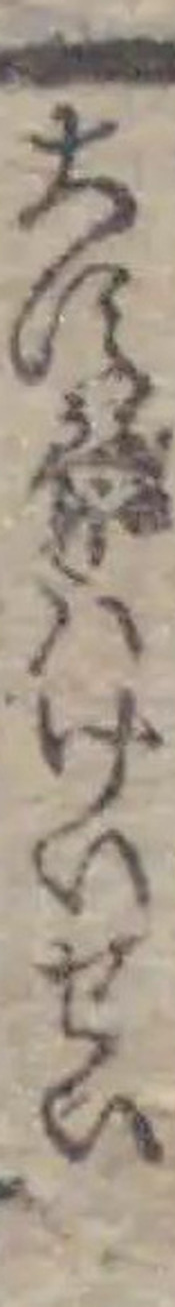大次郎はけいせい
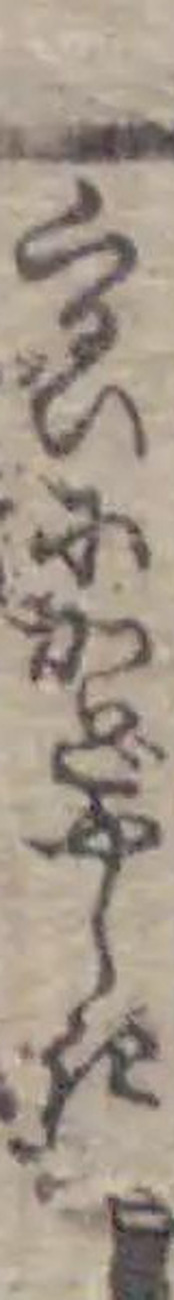くるいにかどやしき
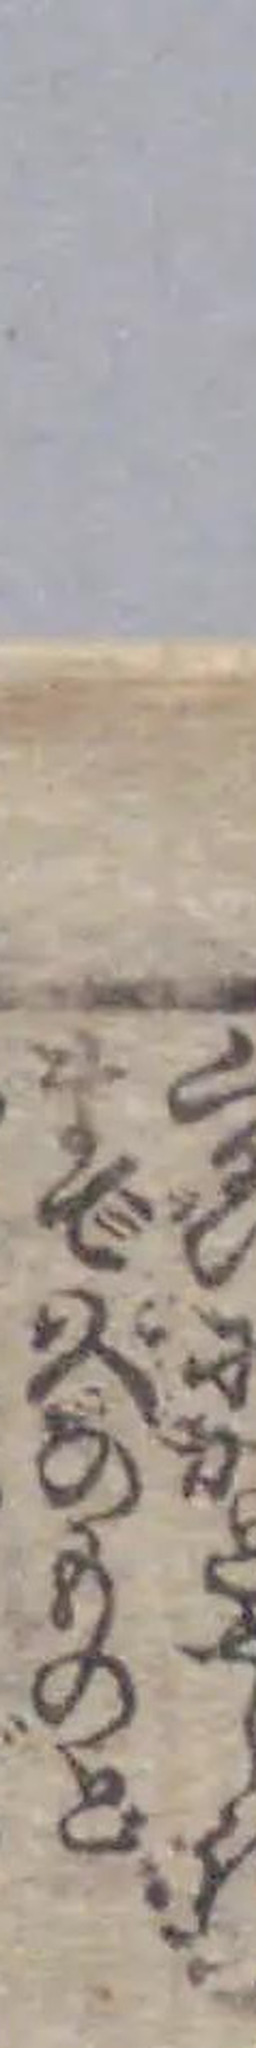まで人のものと
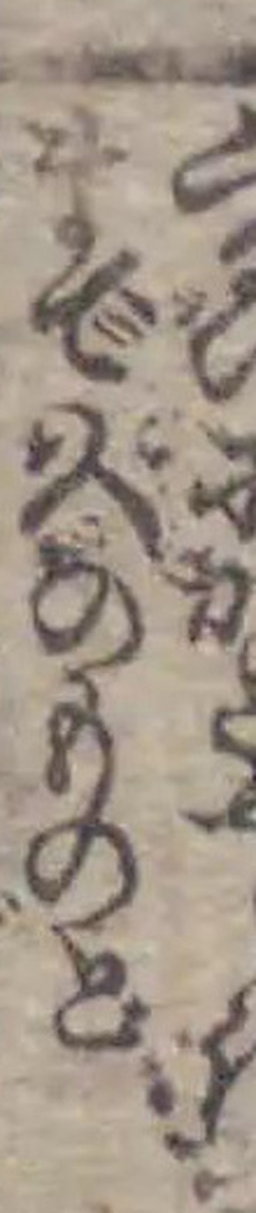まで人のものと
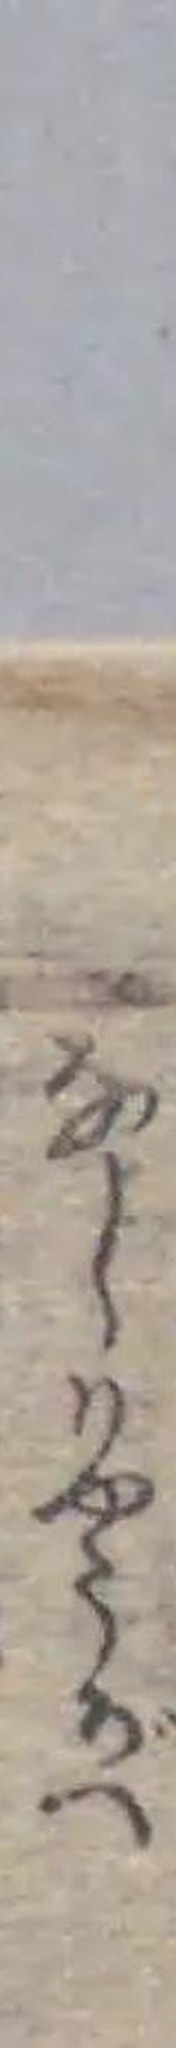なしりやうがへ
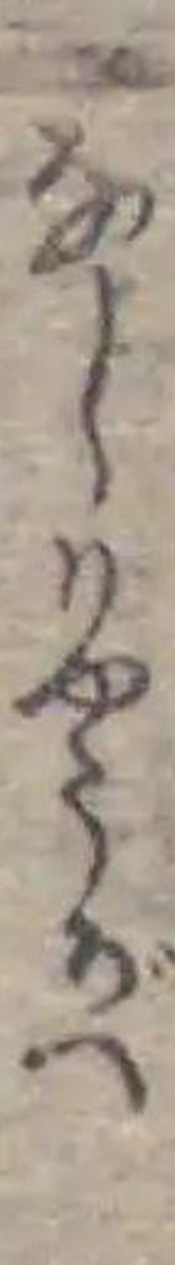なしりやうがへ
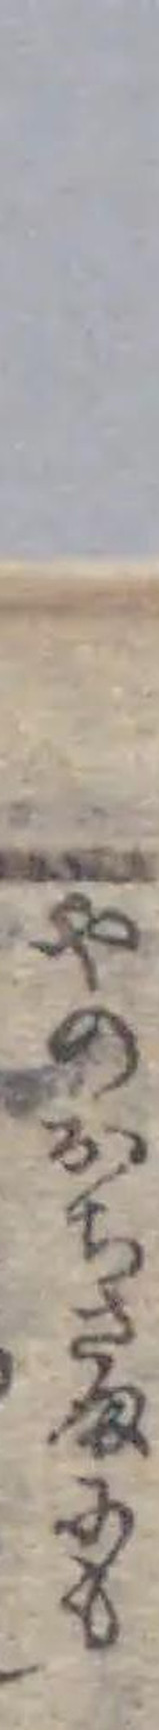屋のおちさまにも
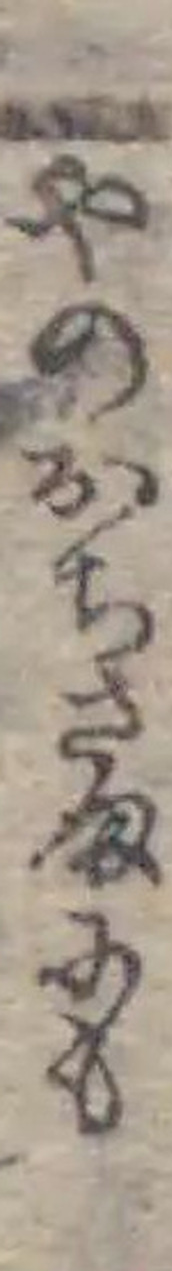屋のおちさまにも
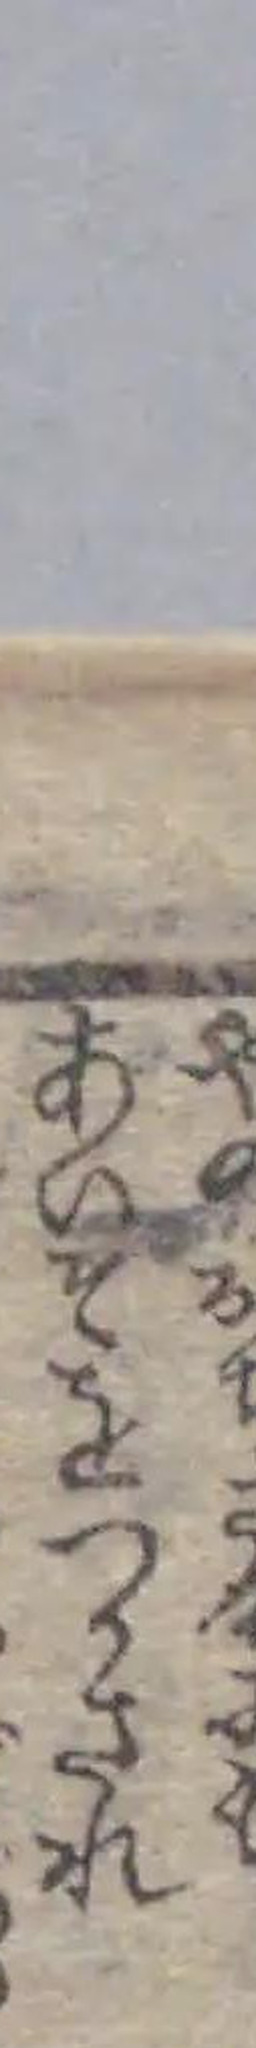あいそをつかされ
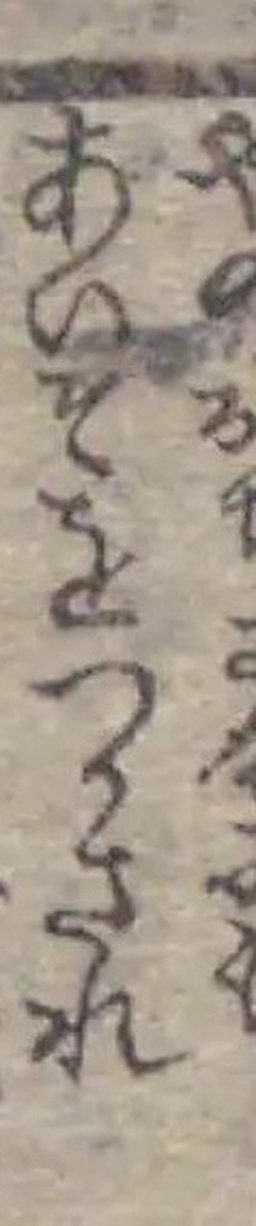あいそをつかされ
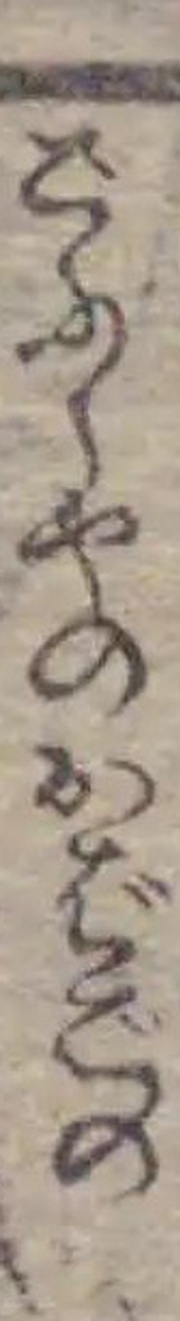ごふくやのおばごの
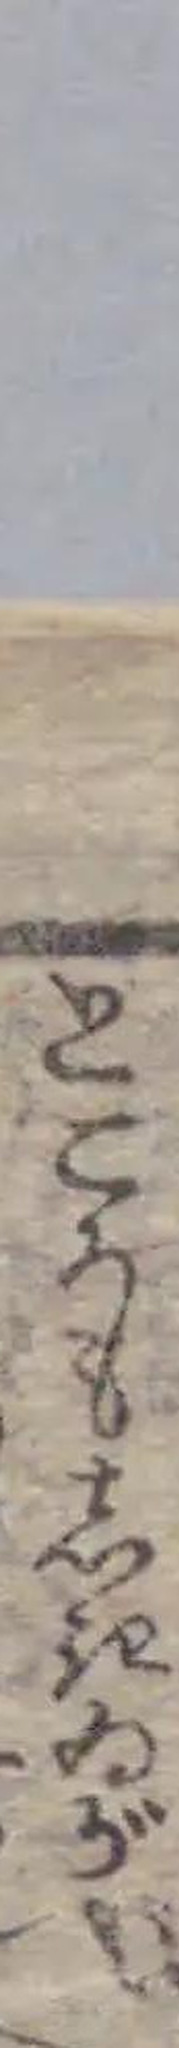ところもしきゐが
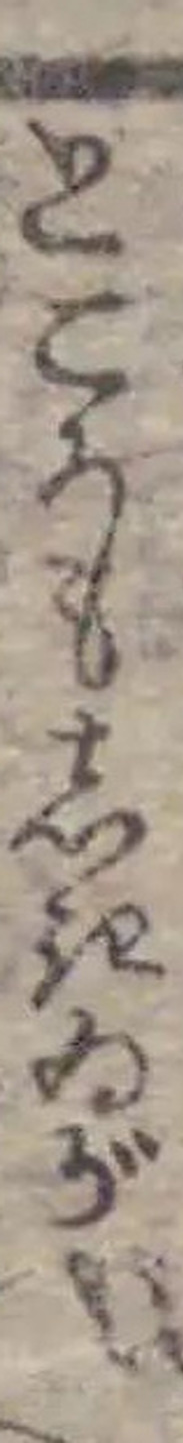ところもしきゐが
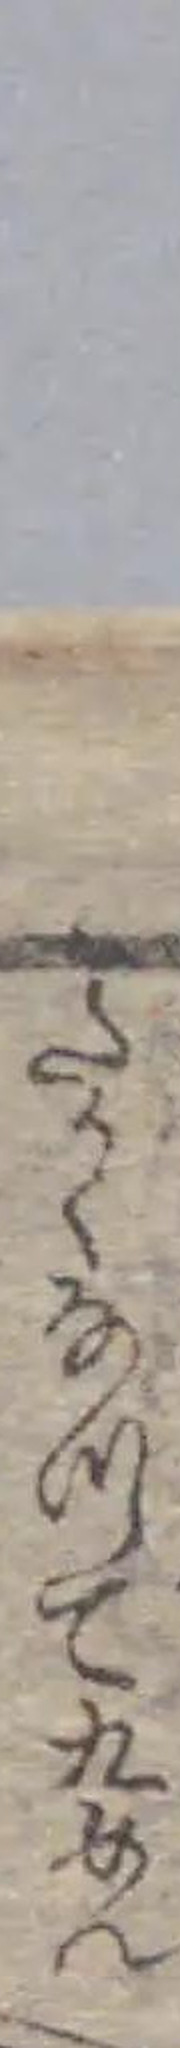たかくなつて九めん
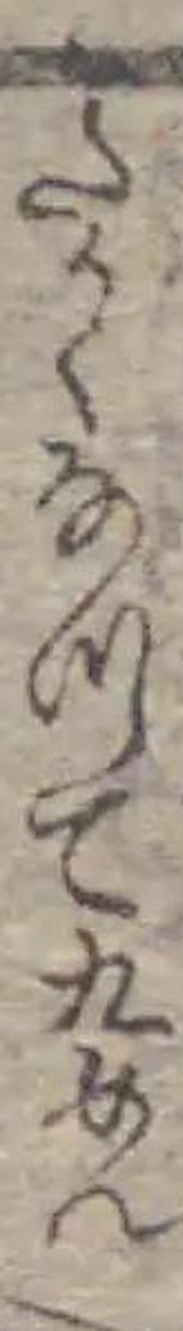たかくなつて九めん
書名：福壽海旡量品玉 3巻
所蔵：国立国会図書館 National Diet Library, JAPAN
